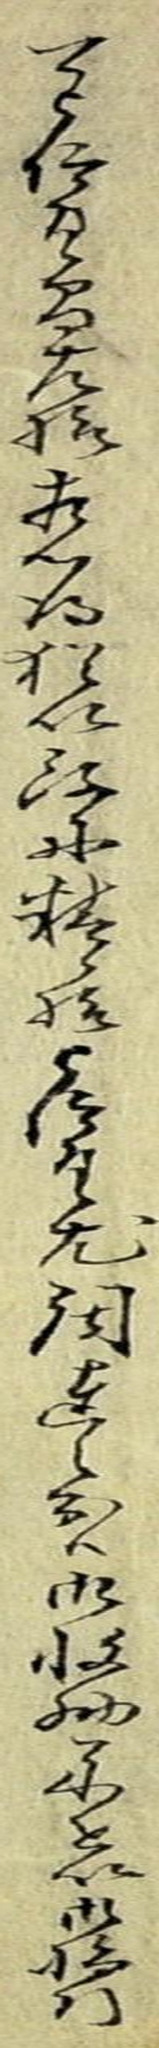可被仰付候間左様相心得猶以致丹精候様被仰付候尤調達之分は御収納米御指引
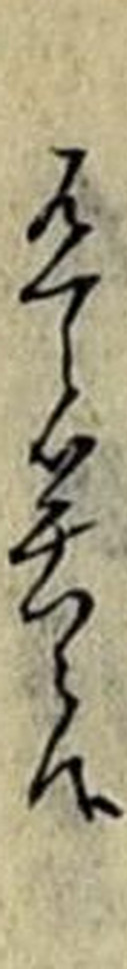有之筈に候
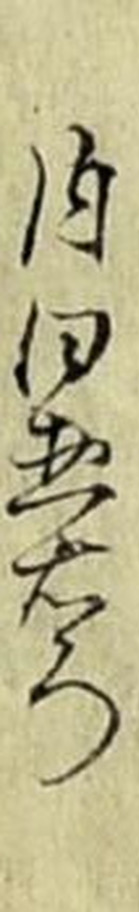内田惣右衛門
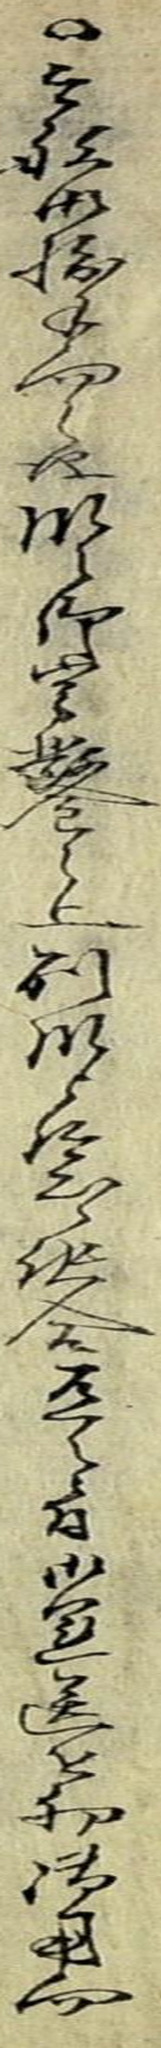○今般御勝手向之儀段々御穿鑿之上別段被仰出候訳合有之に付御運送を初御用向
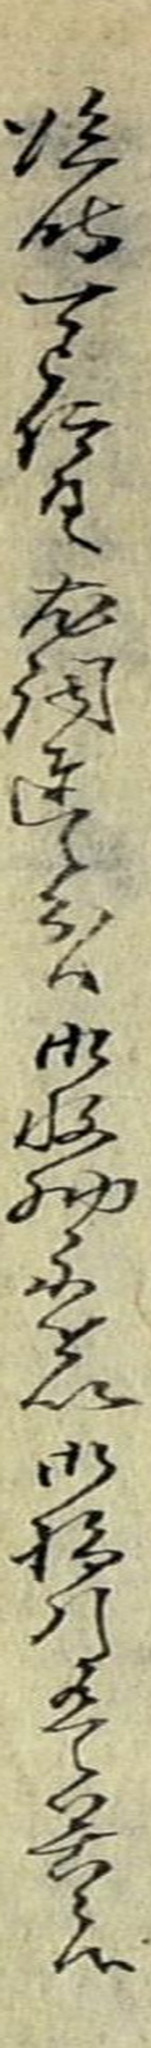臨時可被仰付候尤調達之分は御収納米を以御指引有之筈に候
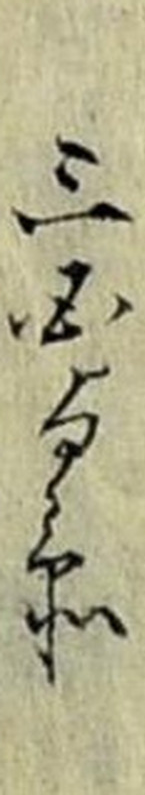三国与兵衛
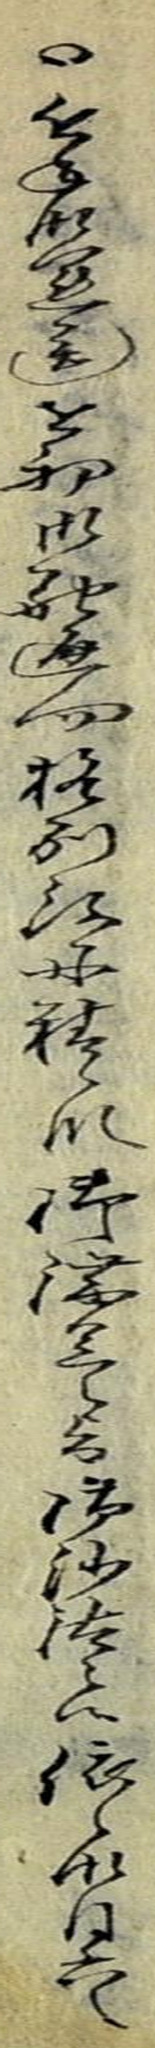○近年御運送を初御融通向格別致丹精候段御満足之旨御沙汰に候依之御目六之
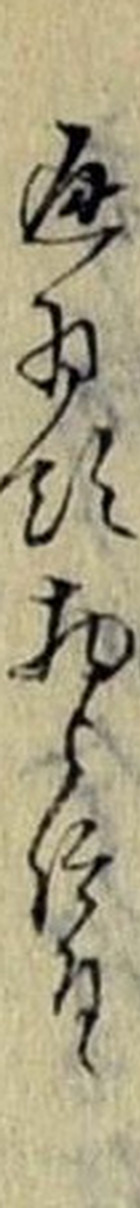通拝領物被仰付候
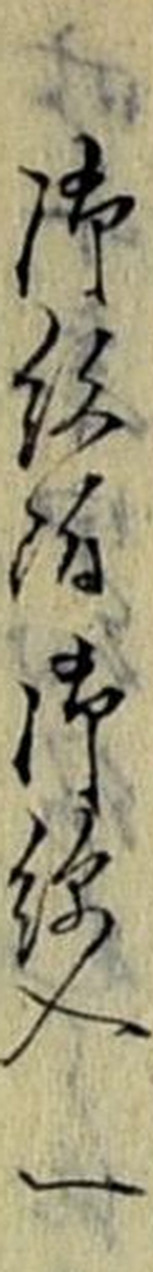御紋附御綿入一
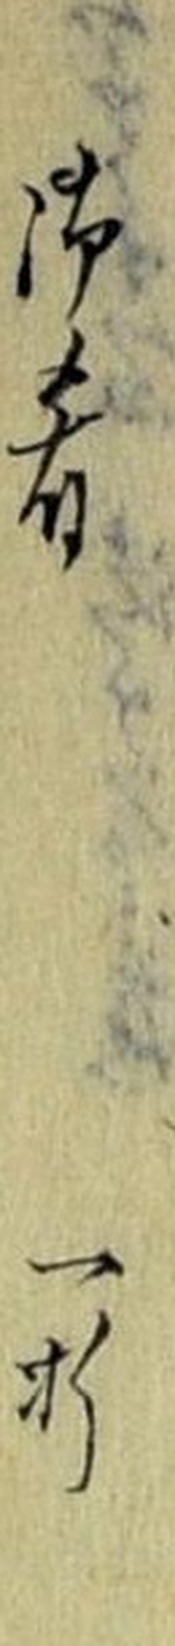御肴一折
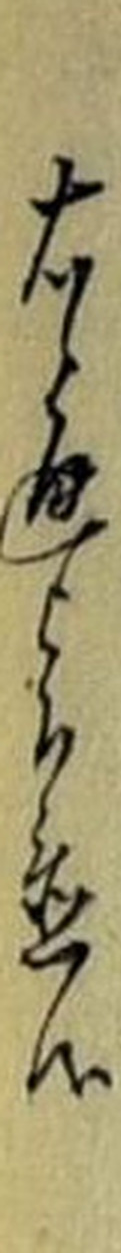右之通被下置候
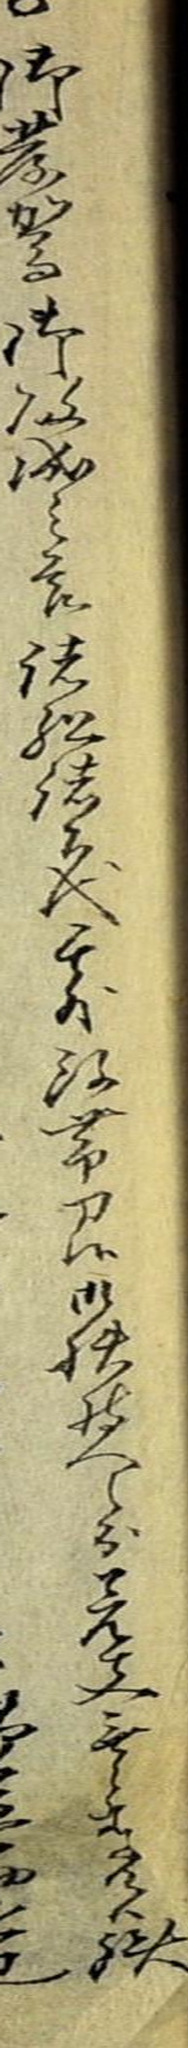○御発駕御帰城之節諸組諸下代其外致帯刀候御扶持人之分差支無之者共は鉄
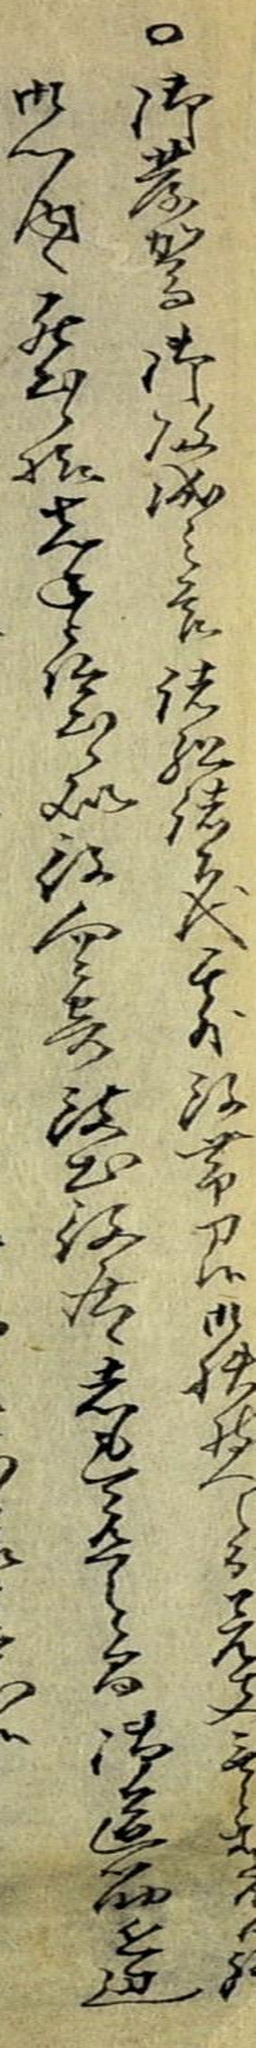御門内へ罷出候様先年被仰出候処役向に寄致出役居候者も可有之候間御道筋近辺
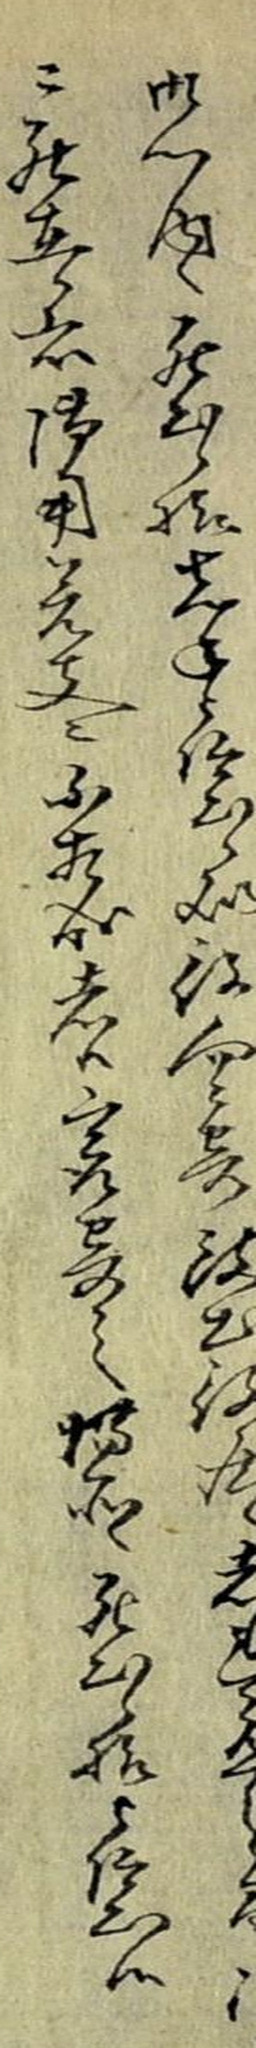に罷在候者御用差支に不相成者は最寄之場所へ罷出候様被仰出候
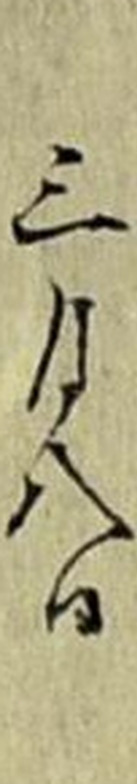三月八日
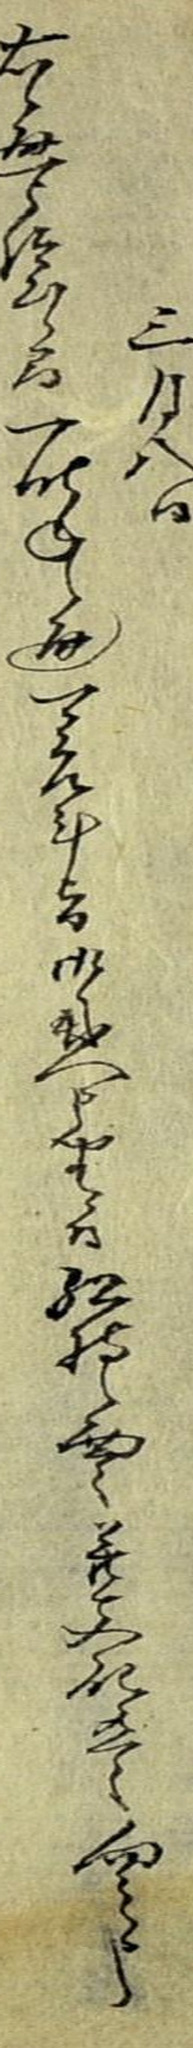右之通被仰出候間一昨年之通可取斗旨御用人申聞候に付組持之面々并支配有之面々申
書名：命令之部 六
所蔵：福井県文書館 Fukui Prefectural Archives
